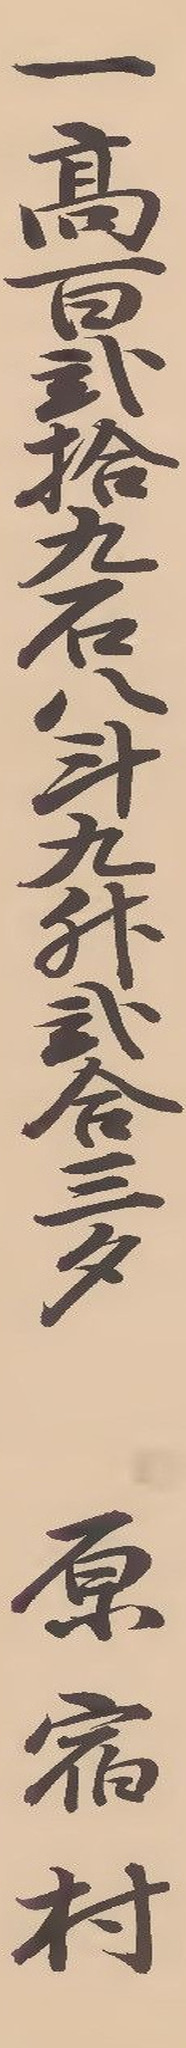一高百弐拾九石八斗九升弐合三勺原宿村

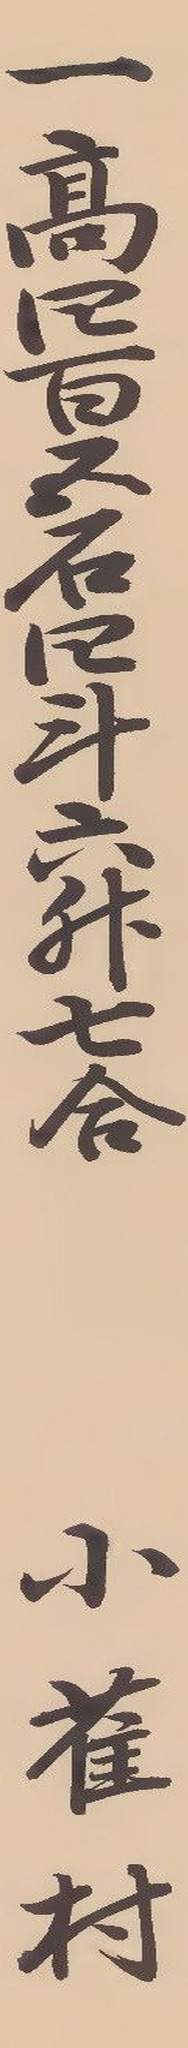一高四百五石四斗六升七合小雀村
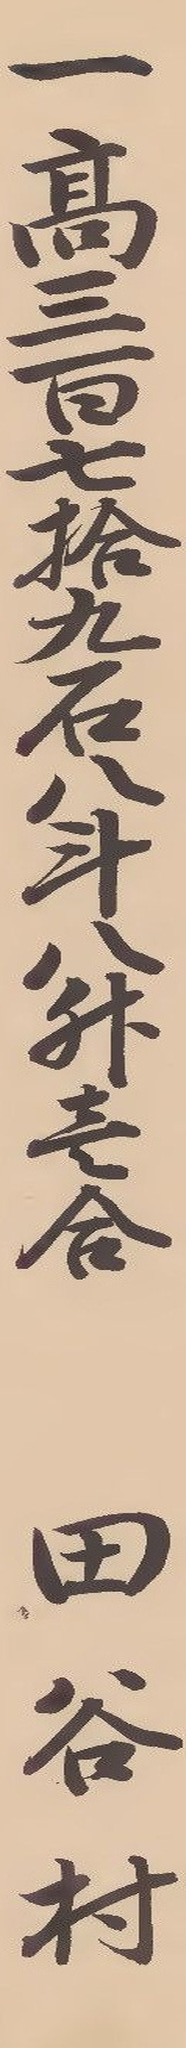一高三百七拾九石八斗八升壱合田谷村
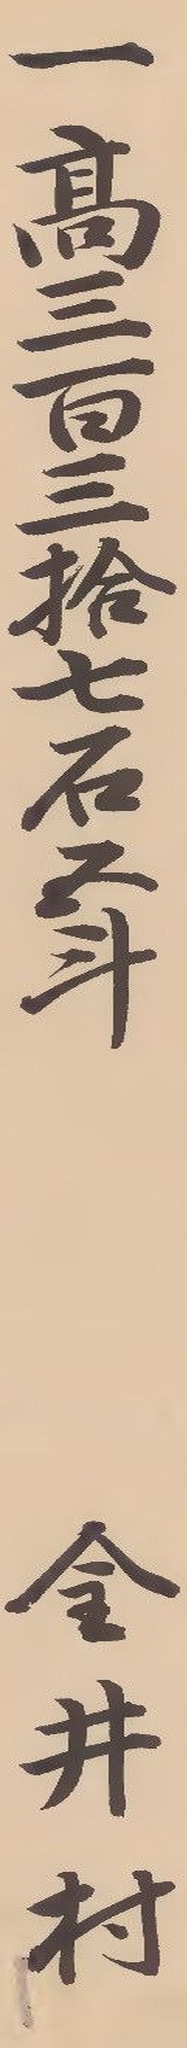一高三百三拾七石五斗金井村
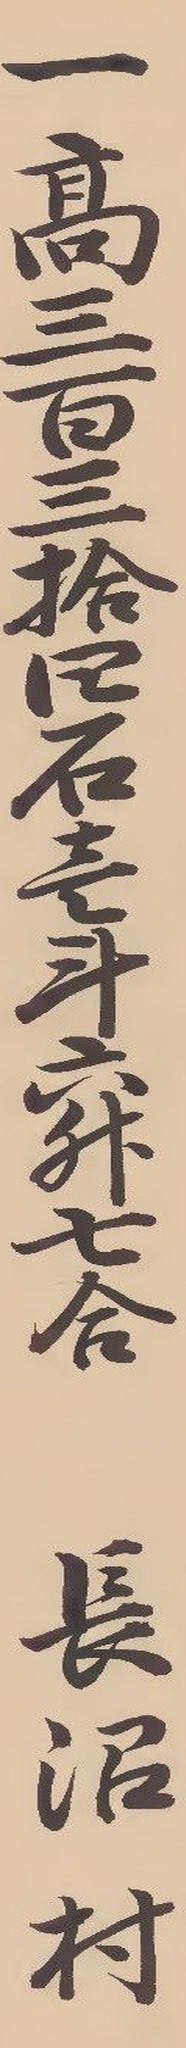一高三百三拾四石壱斗六升七合長沼村
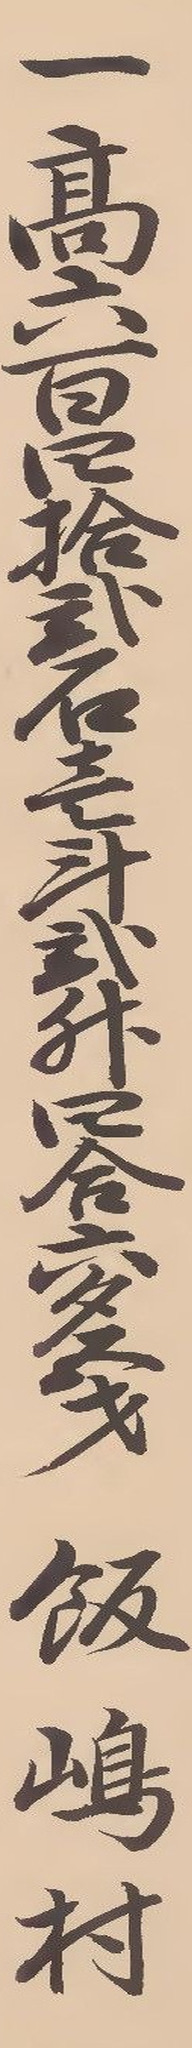一高六百四拾弐石壱斗弐升四合六勺五才飯嶋村
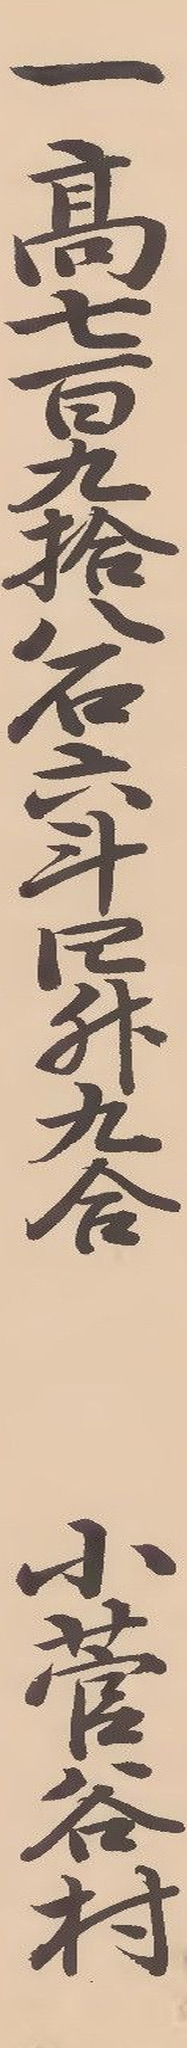一高七百九拾八石六斗四升九合小菅谷村
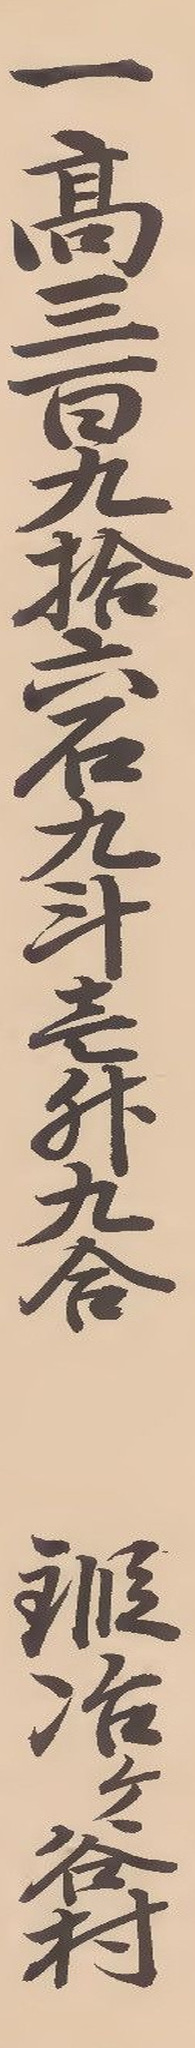一高三百九拾六石九斗壱升九合鍛冶ヶ谷村
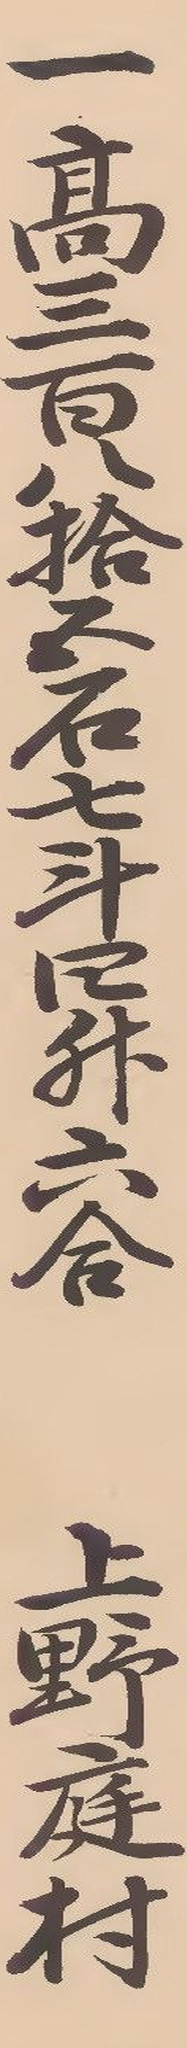一高三百八拾五石七斗四升六合上野庭村

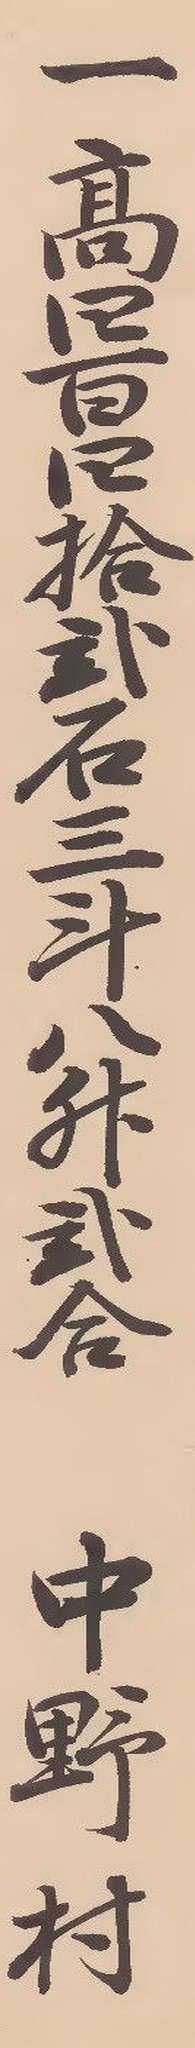一高四百四拾弐石三斗八升弐合中野村
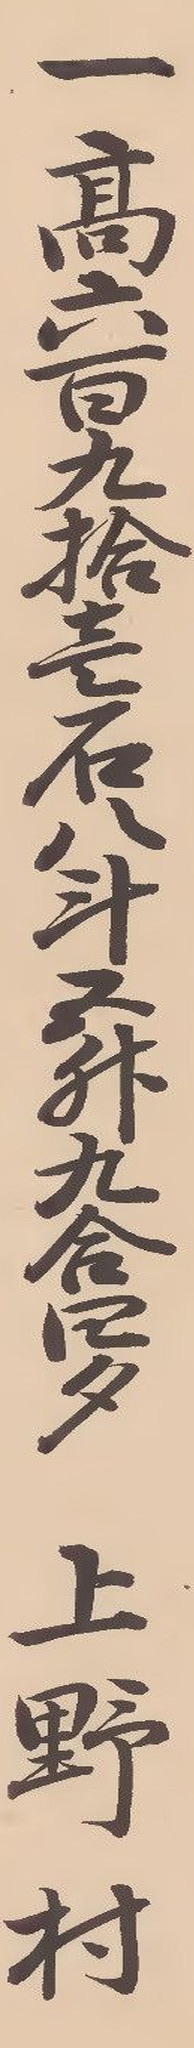一高六百九拾壱石八斗五升九合四勺上野村
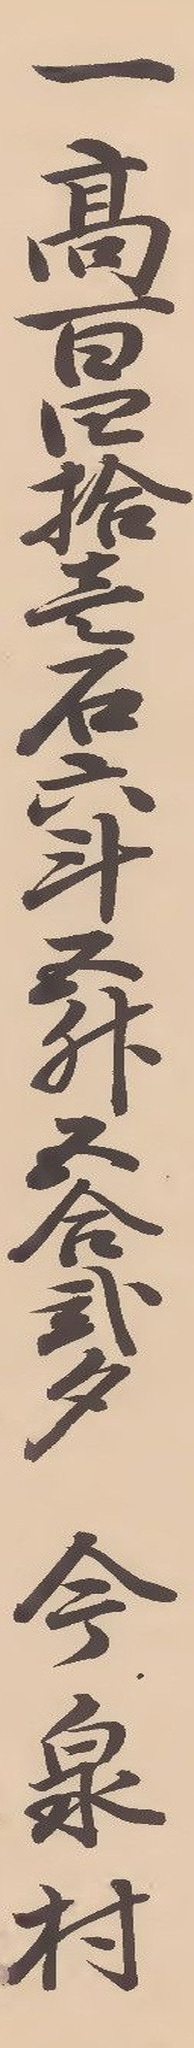一高百四拾壱石六斗五升五合弐勺今泉村
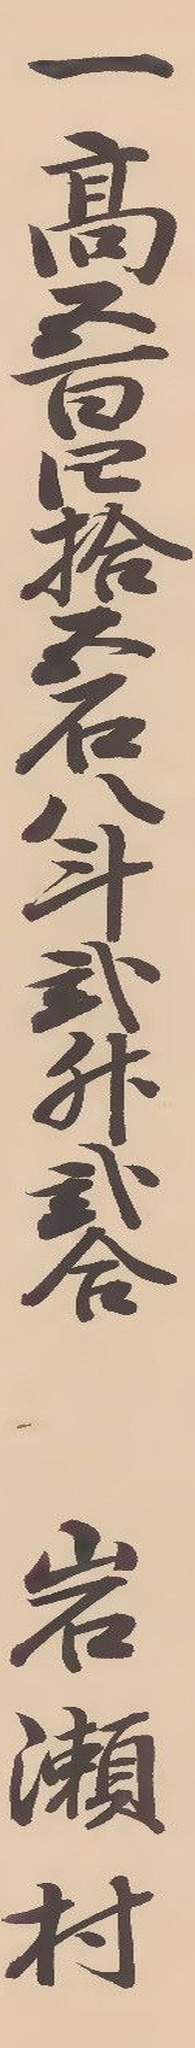一高五百四拾五石八斗弐升弐合岩瀬村
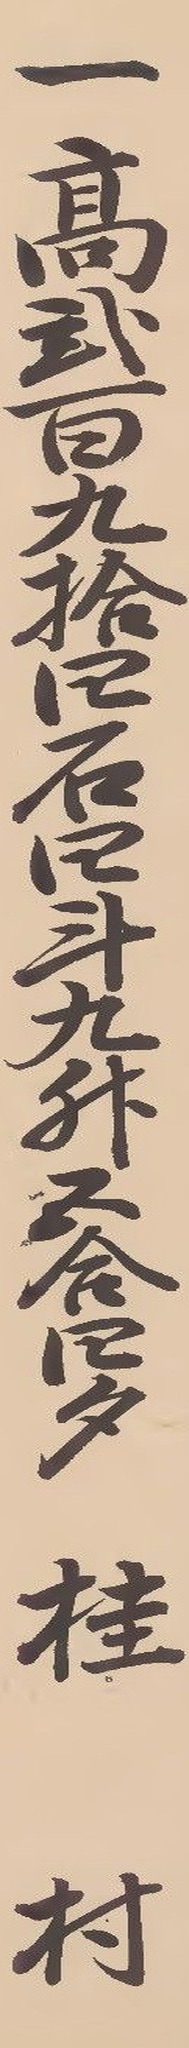一高弐百九拾四石四斗九升五合四勺桂村
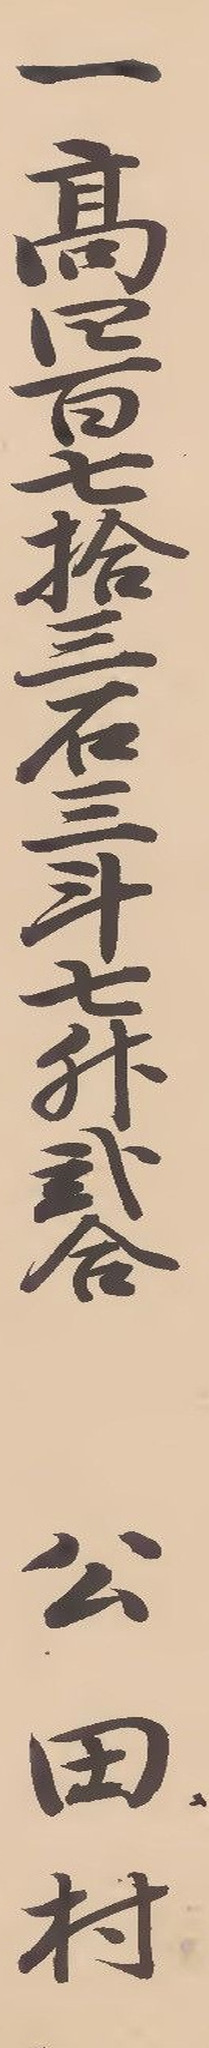一高四百七拾三石三斗七升弐合公田村
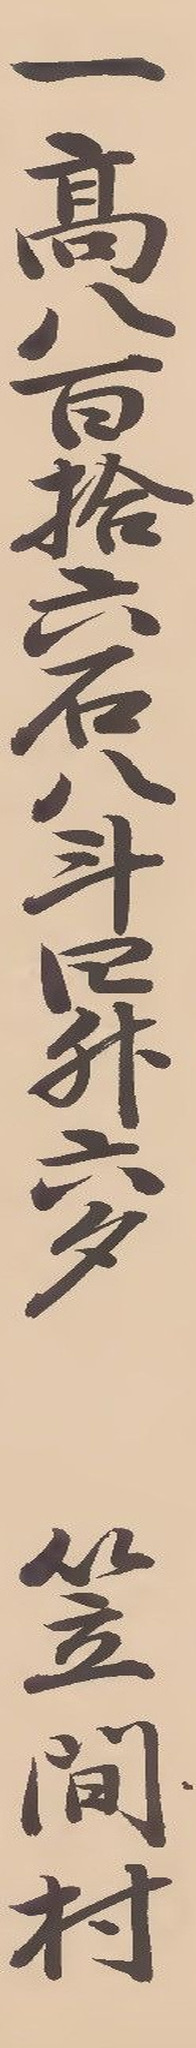一高八百拾六石八斗四升六勺笠間村
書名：相模国郷帳
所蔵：国立公文書館 National Archives of Japan
